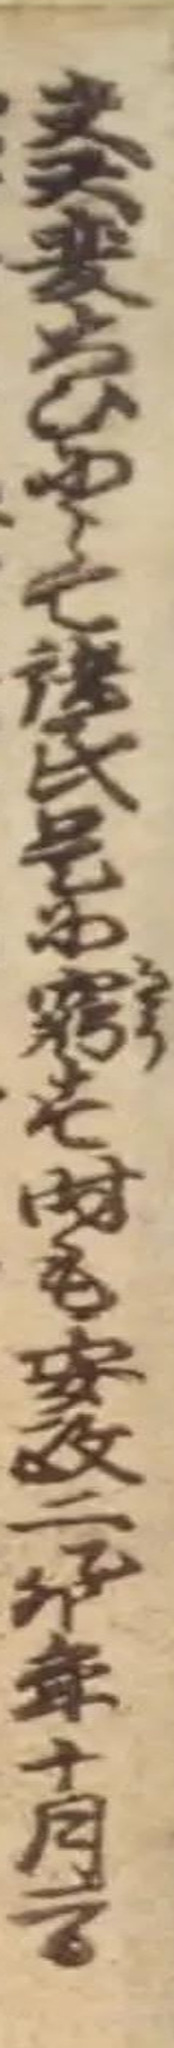夫天変大ひにして諸民是に窮す時も安政二乙卯年十月二日
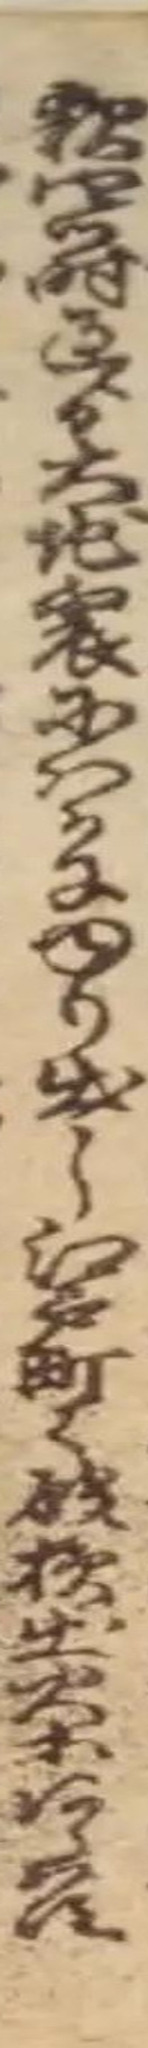夜四つ時過より大地震にはかにゆり出し江戸町ゝ破損出火所あらはす
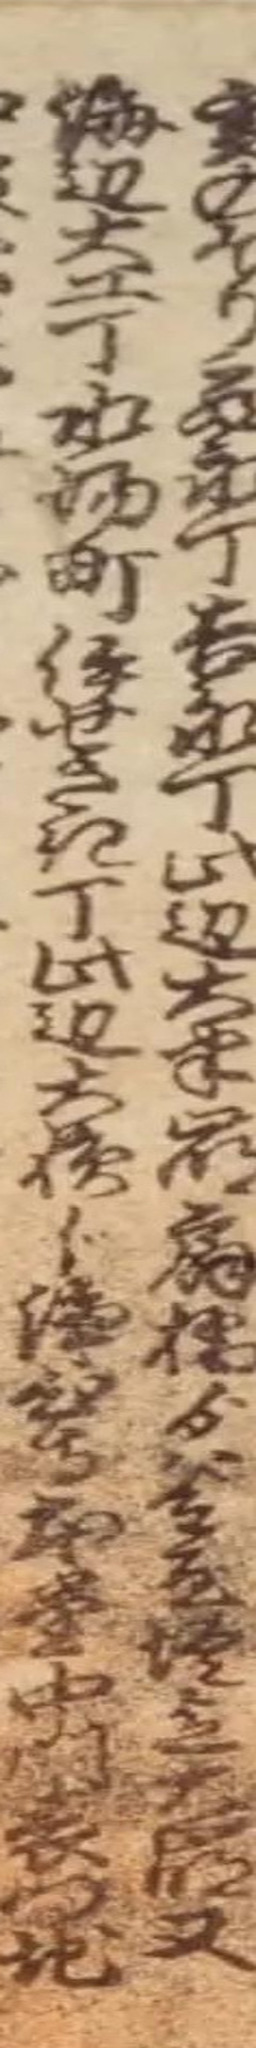海辺大工丁水場町伊せさき丁此辺大損じ浄心寺本堂中門表門地
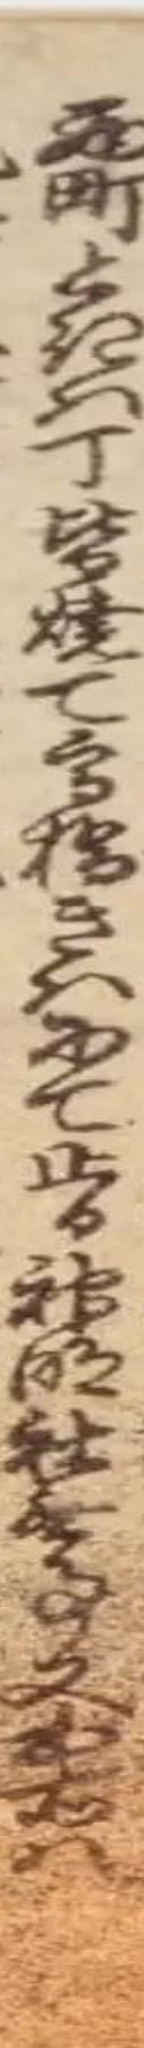西町ときは丁皆焼て高橋きはにて止る神明社無事又出所は
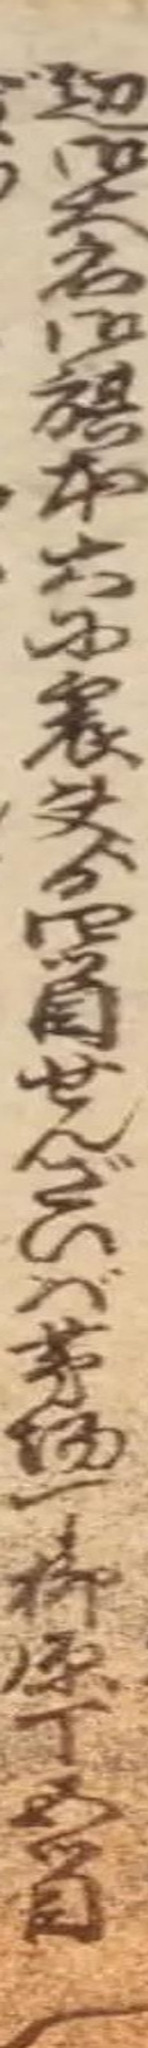辺御大名御旗本大に震夫より四つ目せんざいば茅場丁栁原丁五つ目
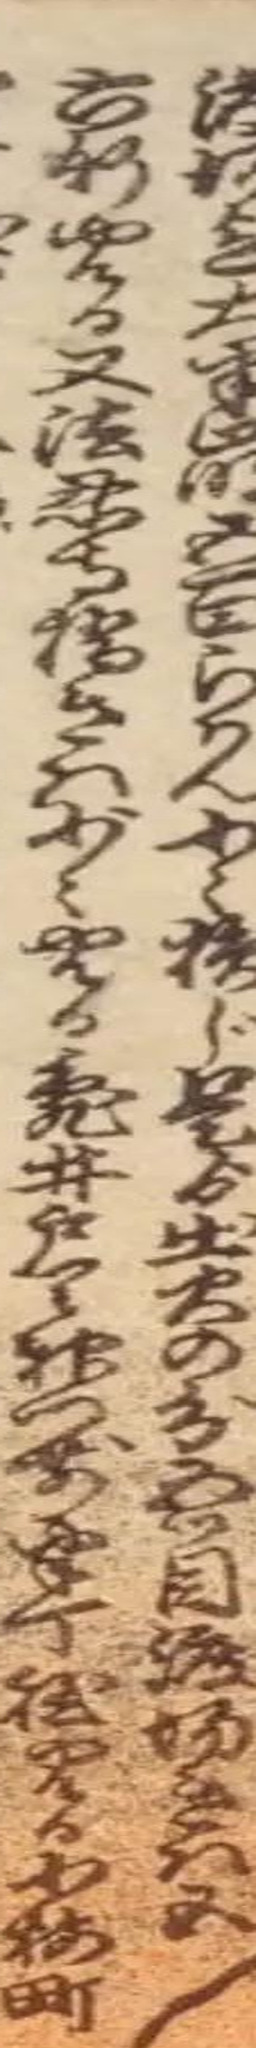六新やける又法善寺橋きは少〃やける亀井戸天神門前半丁程やける小林町
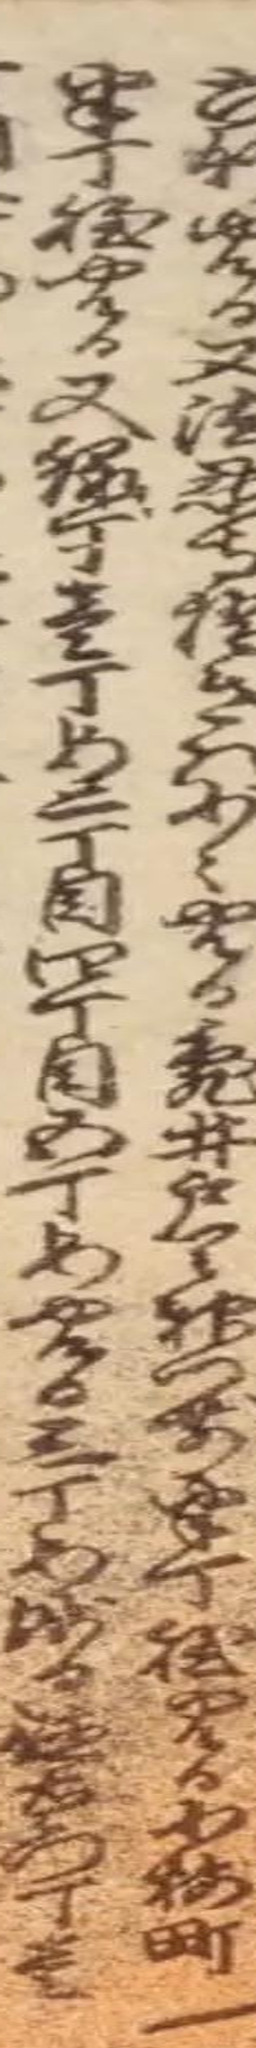半丁程焼ける又緑丁壱丁め二丁目四丁目五丁めやける三丁る徳右衛門丁壱
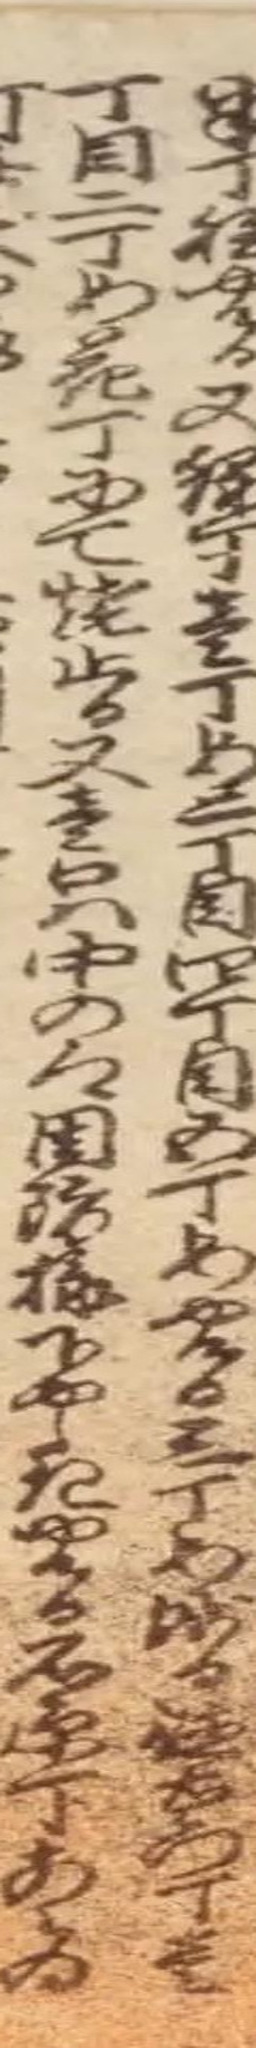丁目二丁め花丁にて焼止る又壱口は中の道周防様下やしきやける石原丁あらゐ
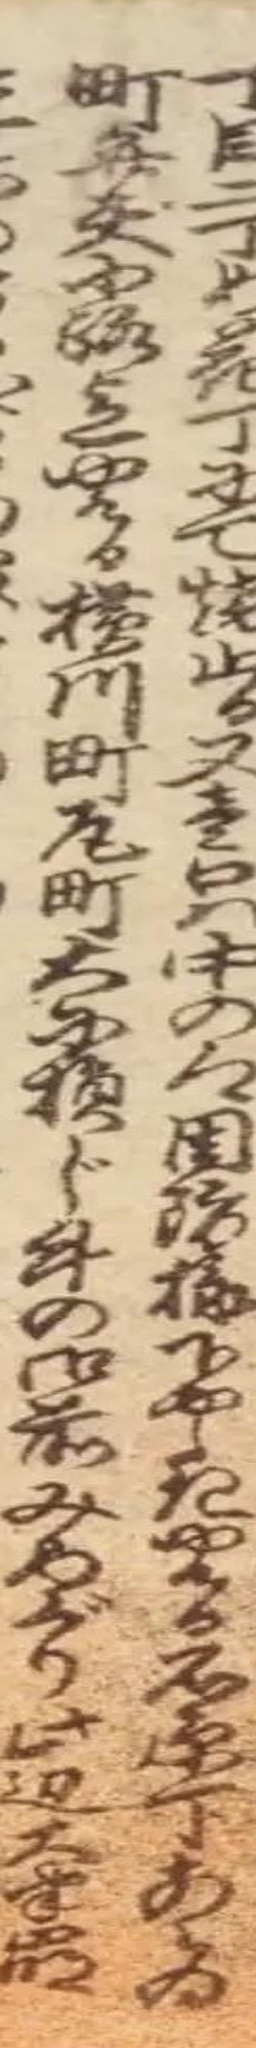町舟夫小路迄やける横川町瓦町大に損じ外の門前みめぐり此辺大半崩
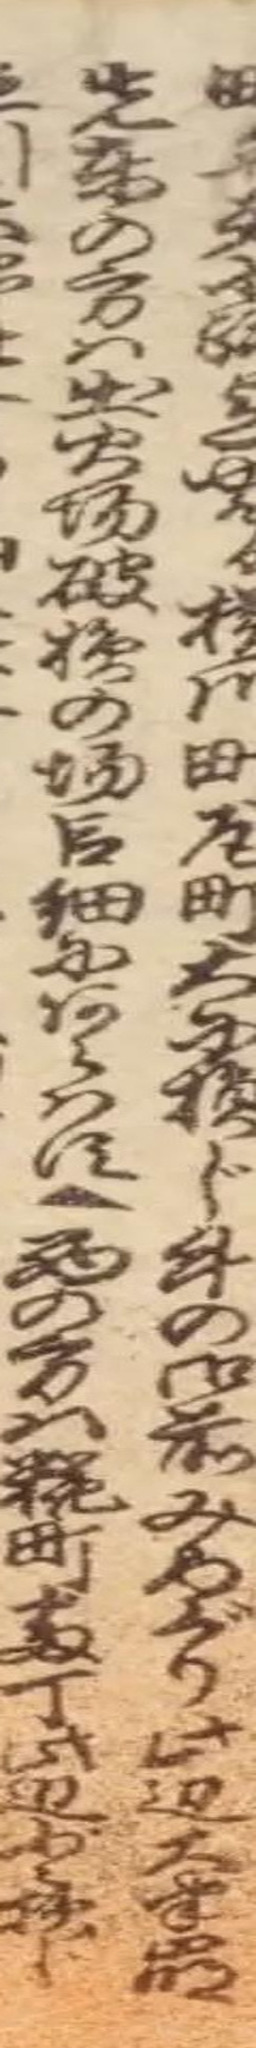先東の方は出火場破損の場巨細にあらはす▲西の方は糀町十数丁此辺少〃損じ
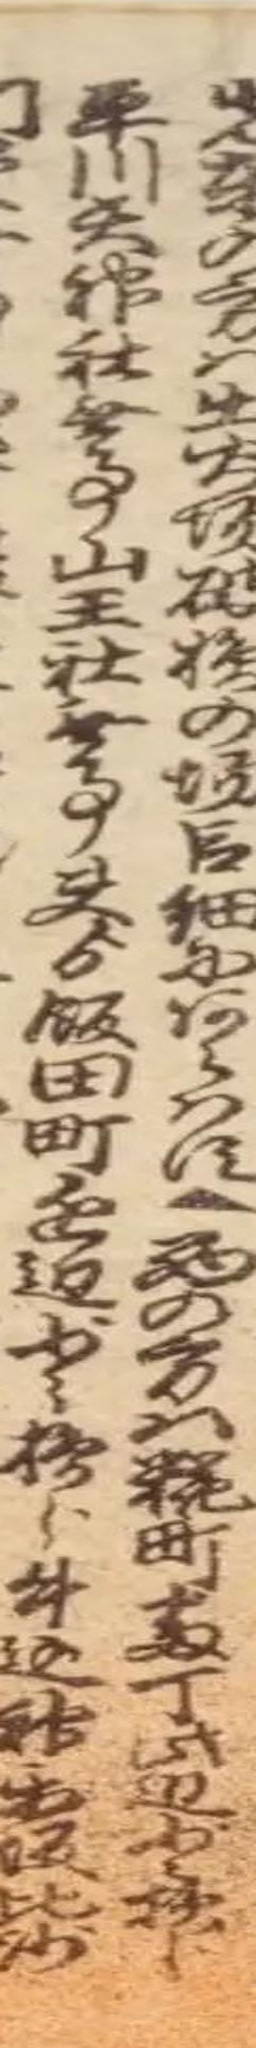平川天神社無事山王社無事夫より飯田町近辺少〃損じ牛込神楽坂此州
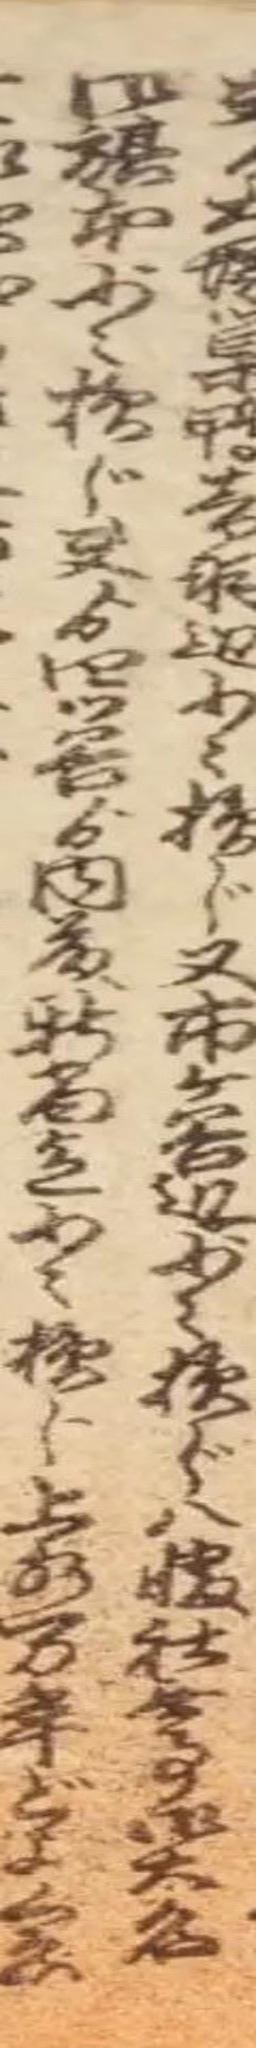御旗本少〃損じ夫より四ツ谷より内藤新宿迄少〃損じ上野万年どよく
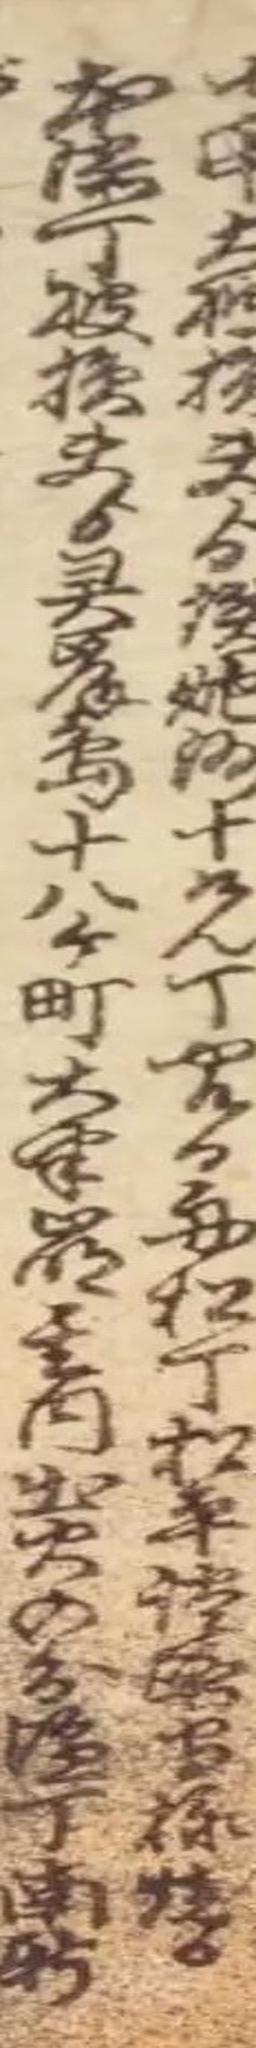本湊丁破損夫より異藤島十八ヶ町大半崩主門出火の分塩丁南新
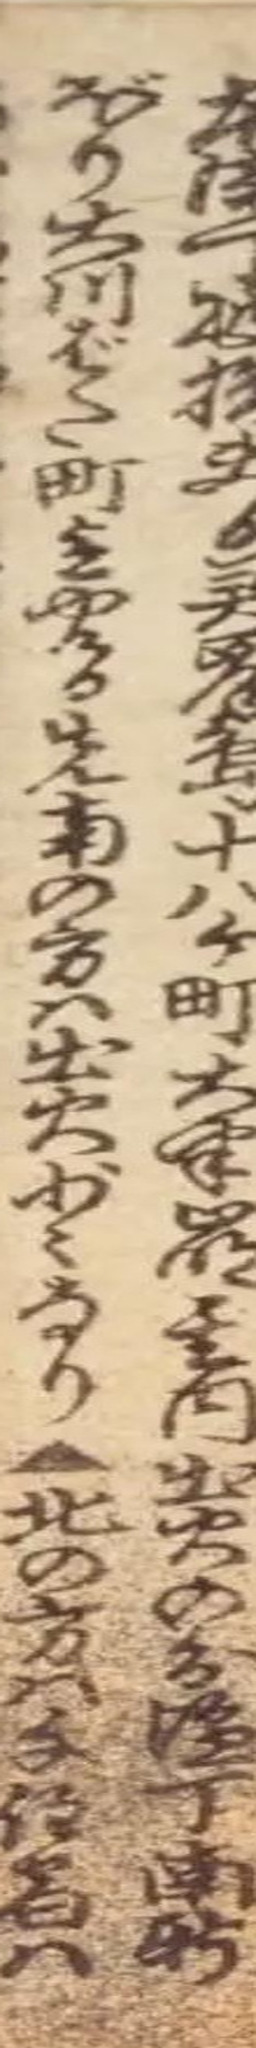ぼり大川ばた町迄やける東南の方は出火少〃なり▲北の方は千住宿は
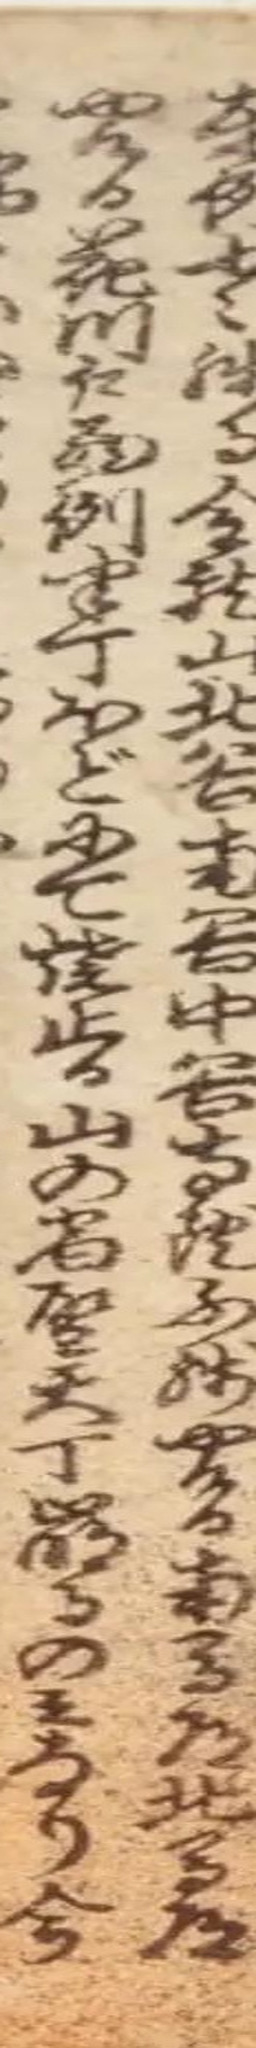やける花川戸西洲半丁ほどにて焼止る山の宿聖天丁崩るのみなり今
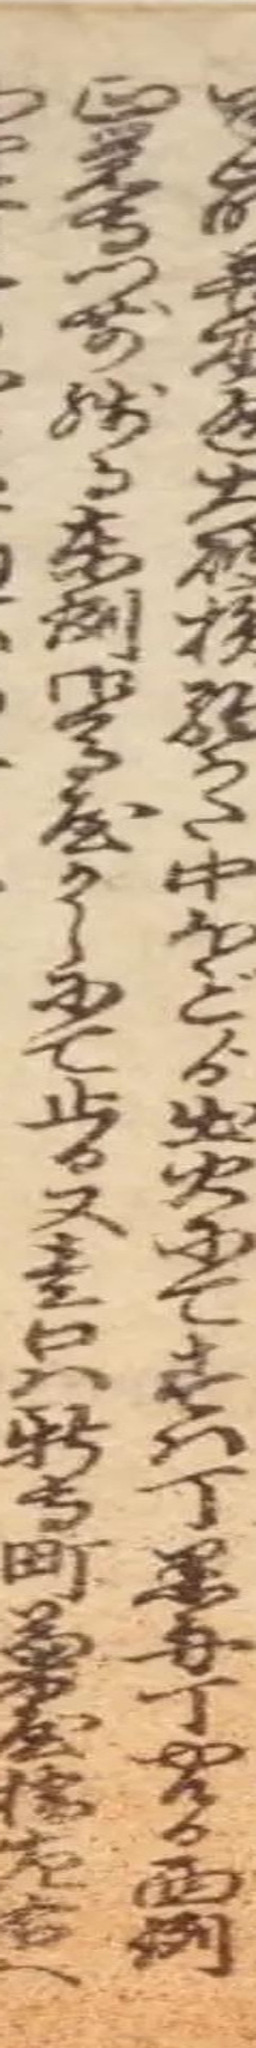正覚寺門前残る東洲御馬屋かしにて止る又其口は新寺町亀屋橋左右へ
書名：（安政二年江戸大地震火事場の図）
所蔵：国立国会図書館 National Diet Library, JAPAN
